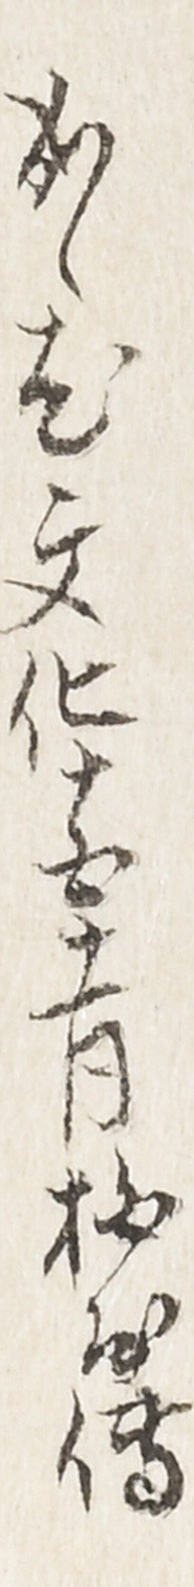成候尤文化十五十一月柏屋伝
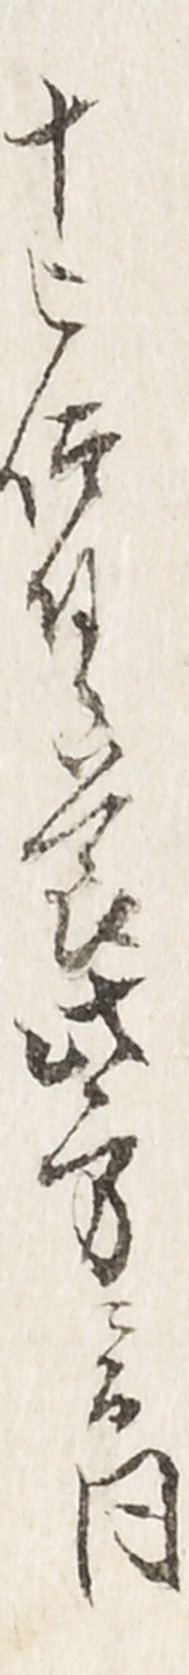十被仰付候節此方ニ而同
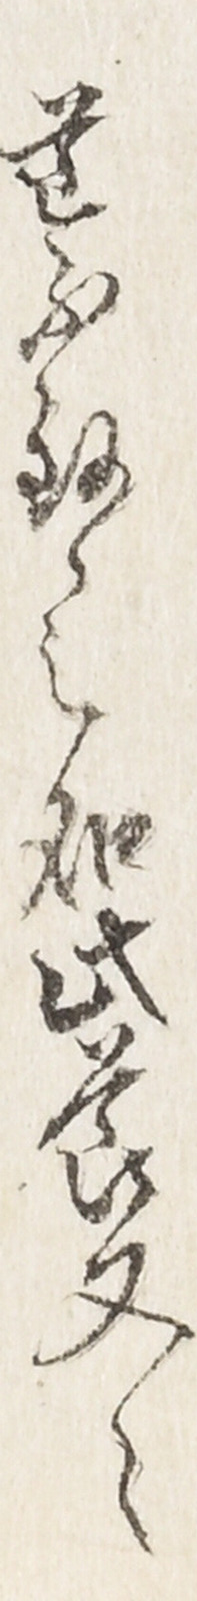道不致之処此節又々
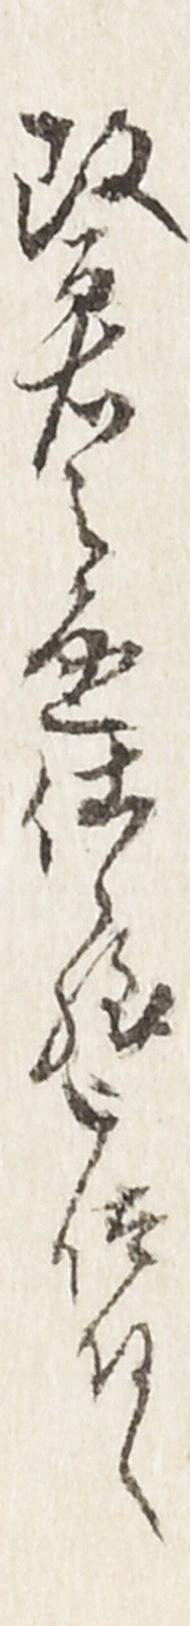改而右之通仕候様被仰付候
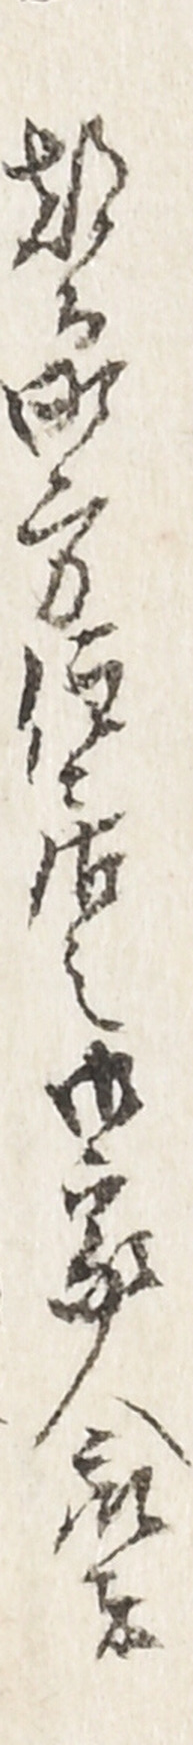一都而町方住居之御家人衆者
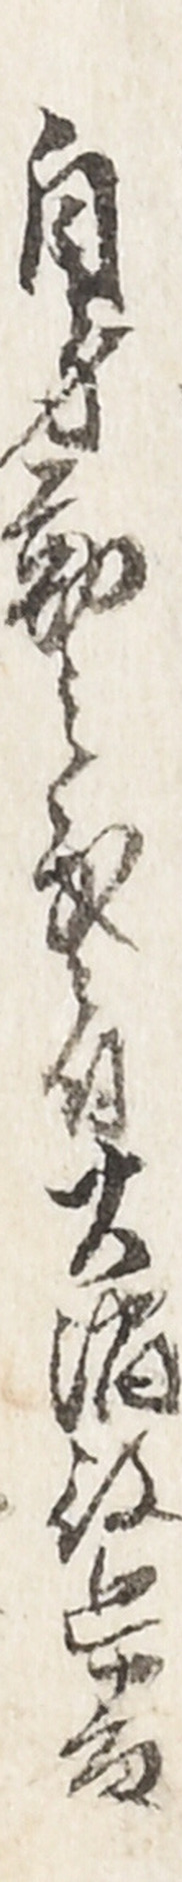自身勤之義ニ付火消役廻番
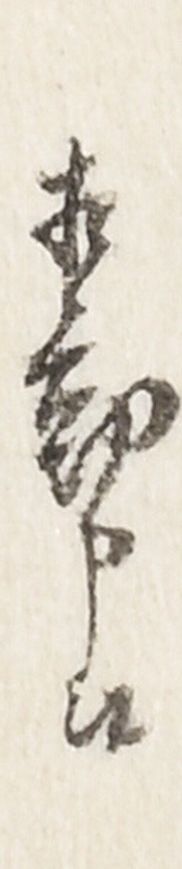相勤申候
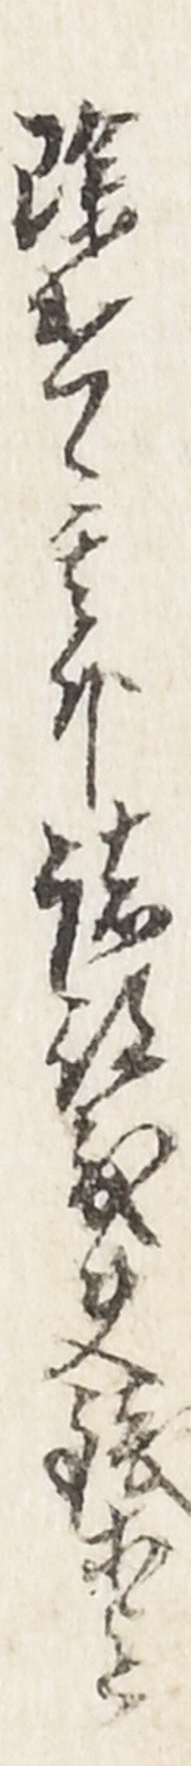除遣候其外諸役義夫銭等迄
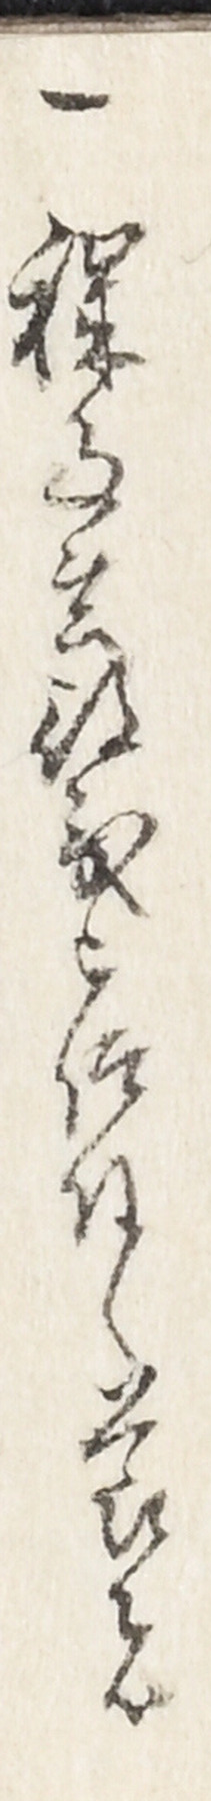一穢多玄役義被仰付候節は
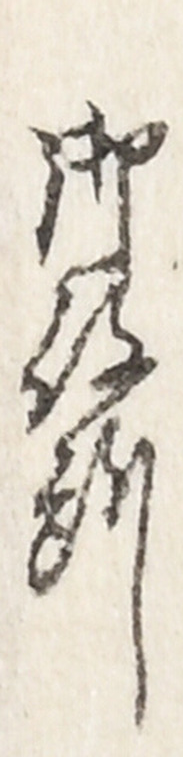御役所

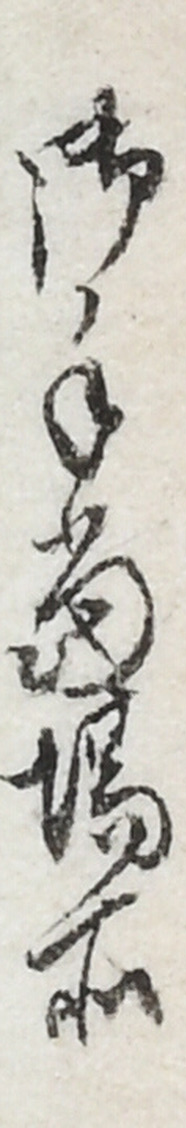御手当場所
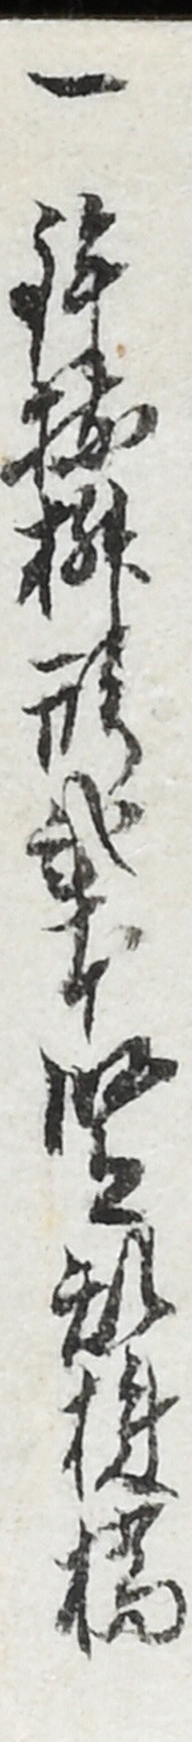一鉢持枡形弐本竪乱株橘
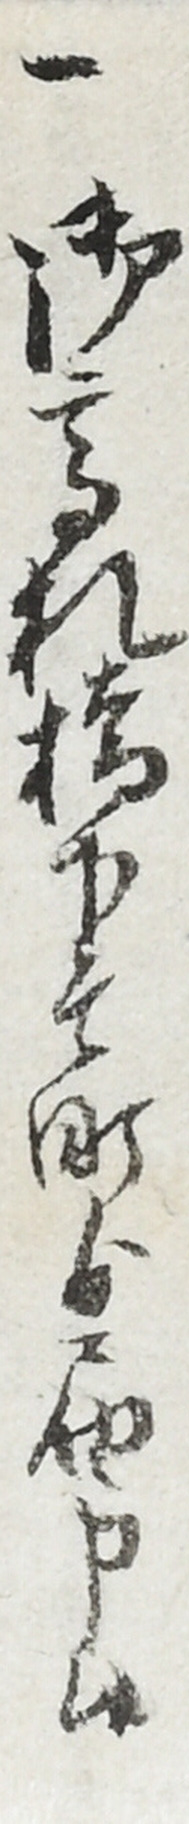一御高札橋下其町より届申候
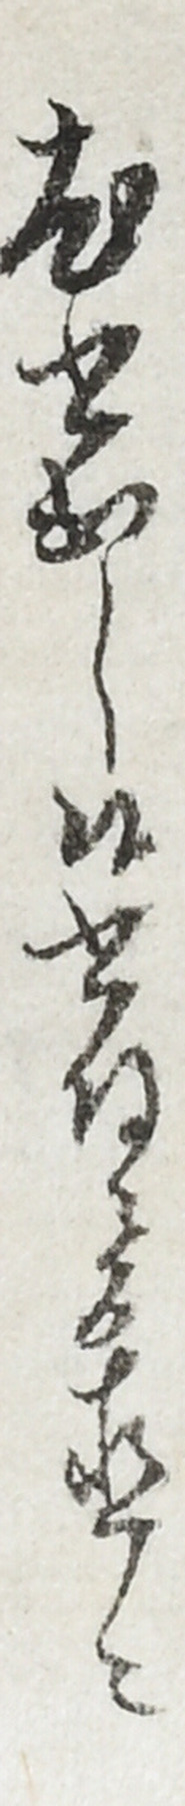尤書出し候書付ニ而直ニ
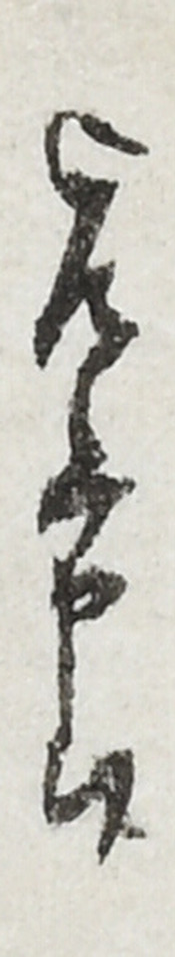差上申候
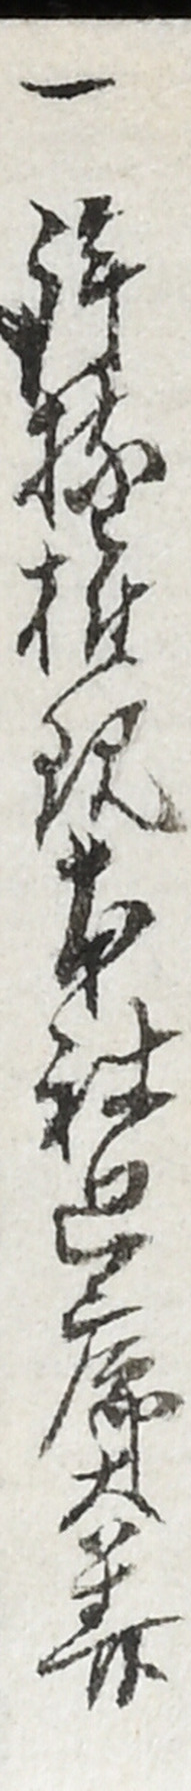一鉾持権現本社廻廊大算
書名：年内行事懐中録
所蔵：伊那市立高遠町図書館・合同会社AMANE
